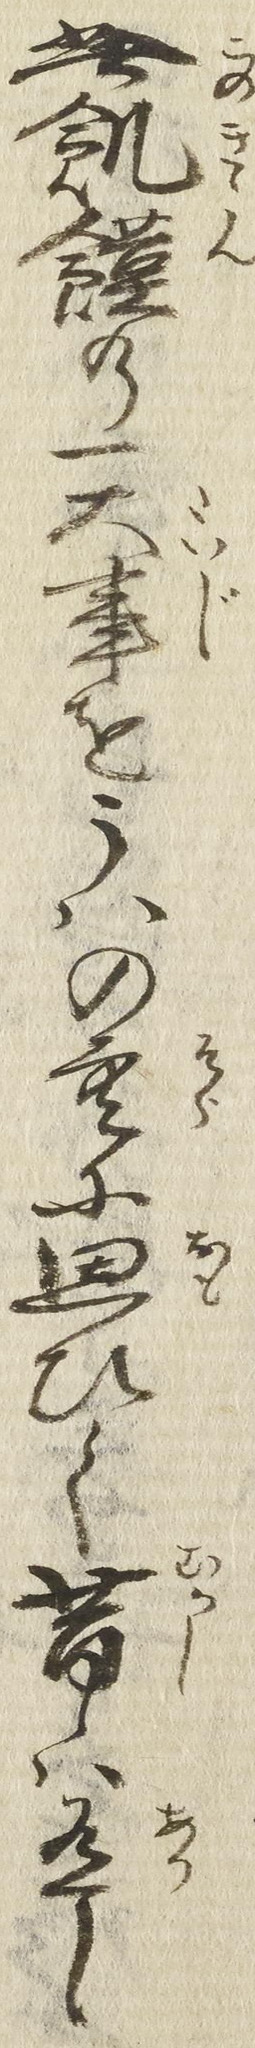此飢饉の一大事をうはの空に思ひて昔は有し
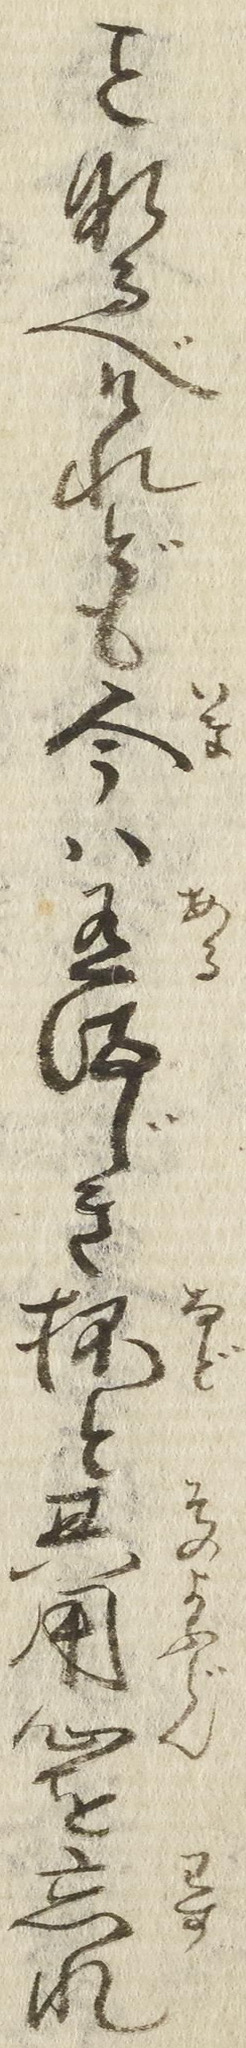ことなるべけれども今は有まじき抔と其用心を忘れ
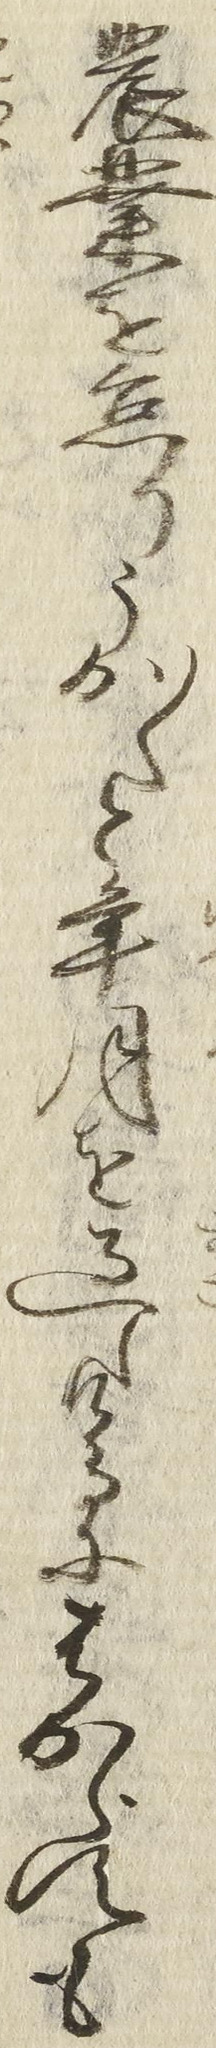農業を怠りうか〳〵と年月を過しけるにはからすも
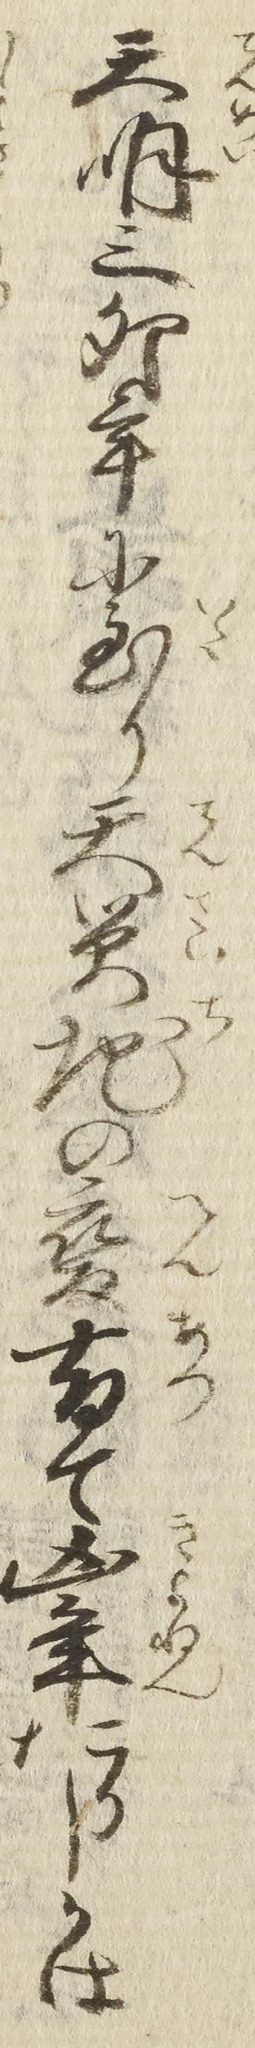天明三卯年に至り天災地の変有て凶年たりしかは
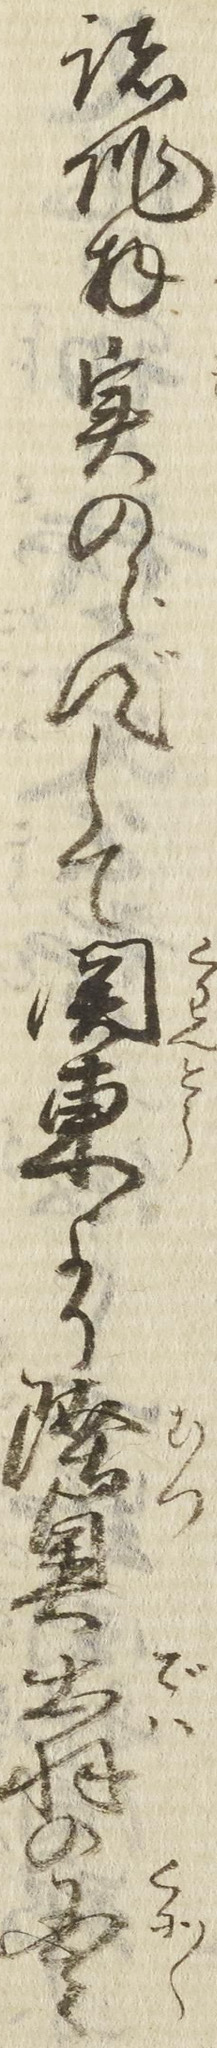諸作物実のらずして関東より陸奥出羽の国〻
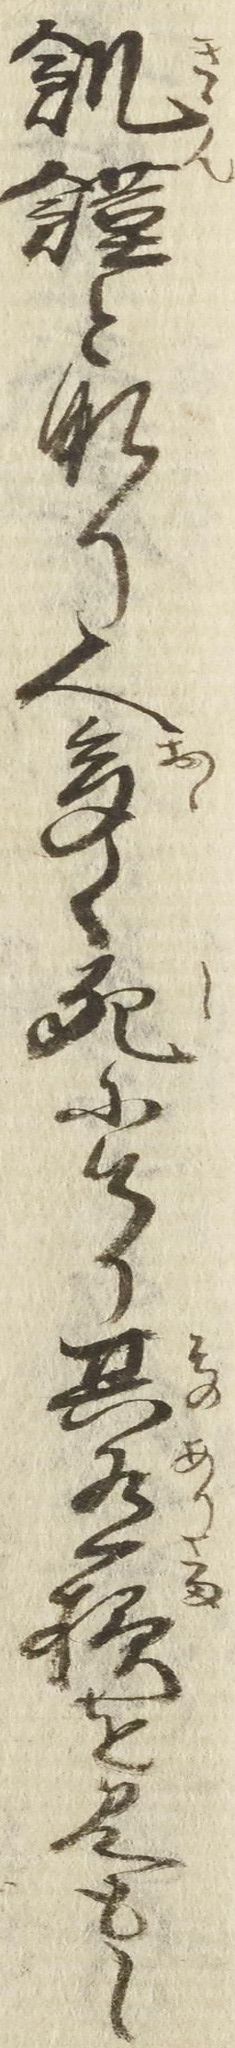飢饉となり人多く死にけり其有様を見もし
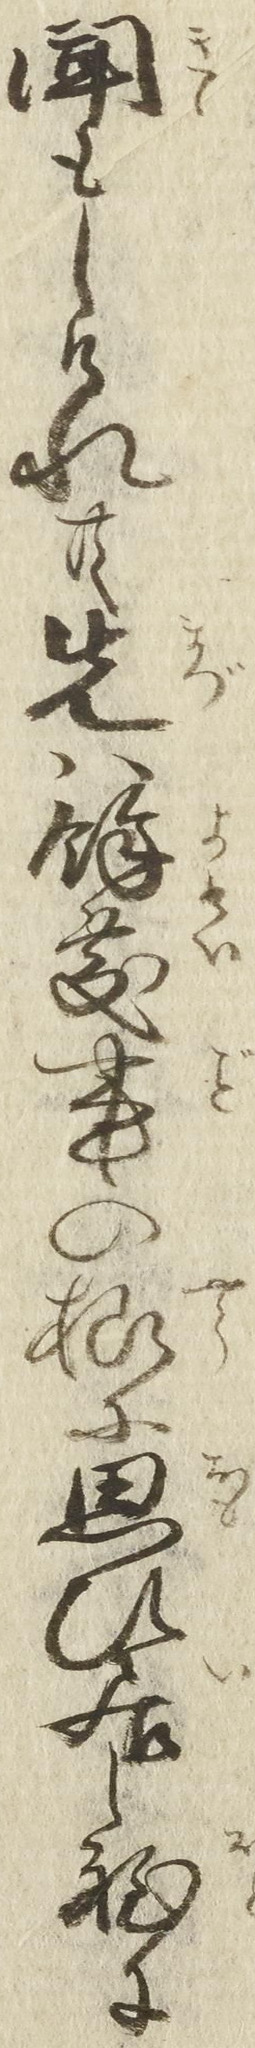聞もしけれ共先は余慶事の様に思ひ居し程に
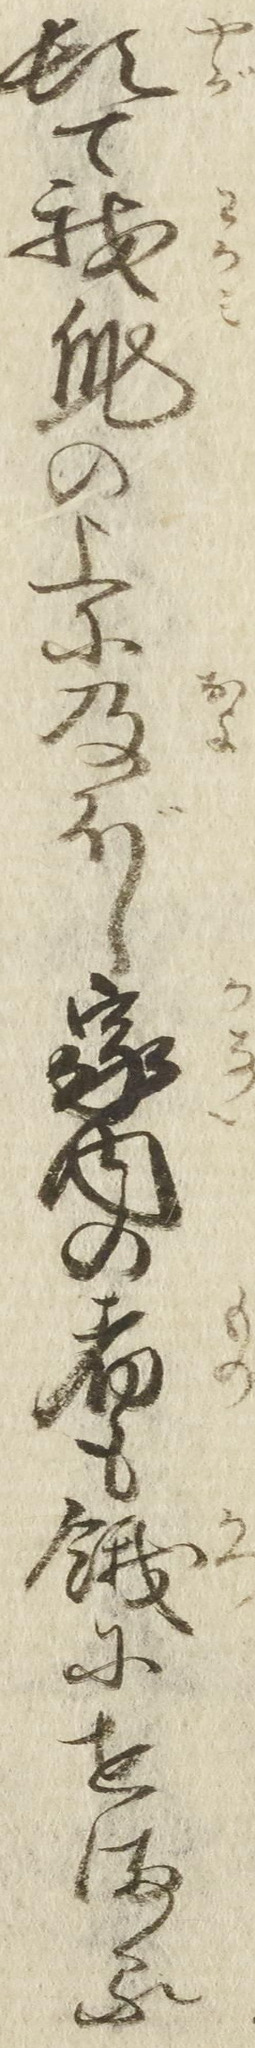頓て我身の上に及ぼし家内の者も餓にせまる
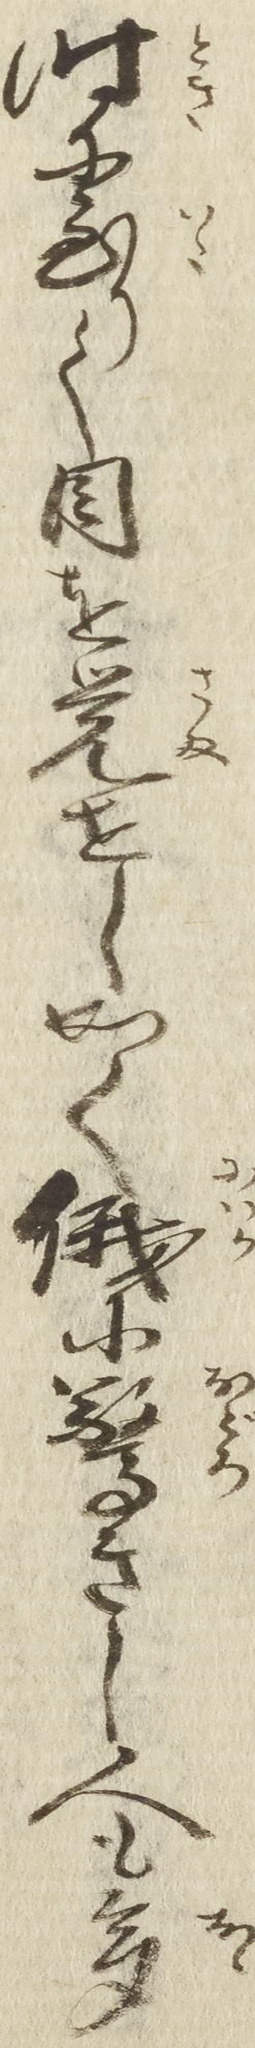時に至りて目を覚せし如く俄に驚きし人も多
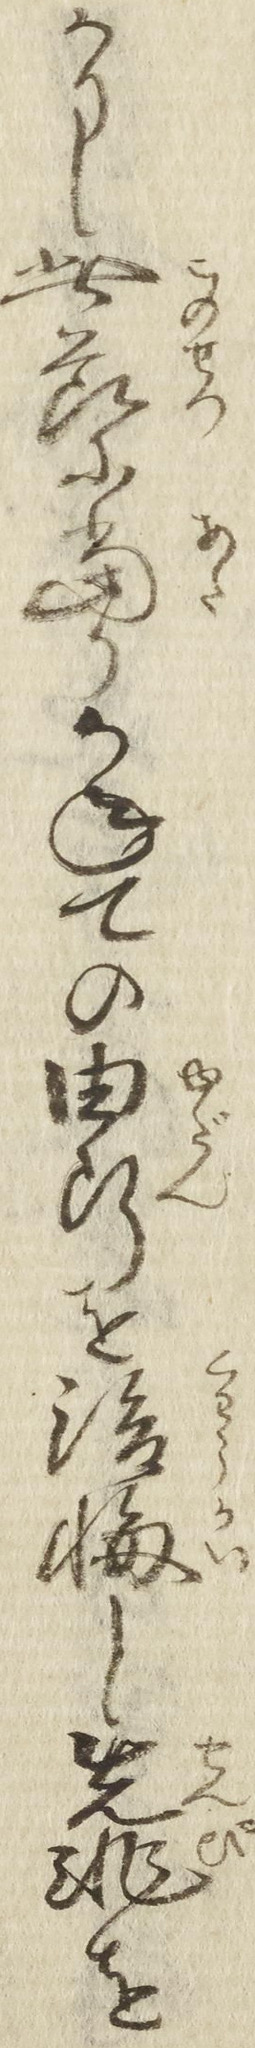かりし此節に当りかねての油断を後悔し先非を
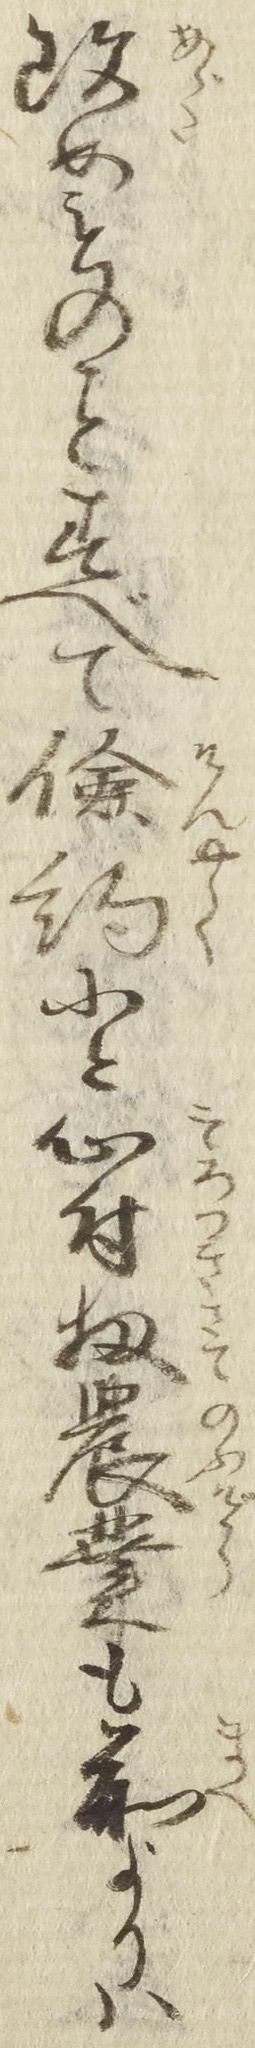改めものことすべて倹約にと心付扨農業も前よりは
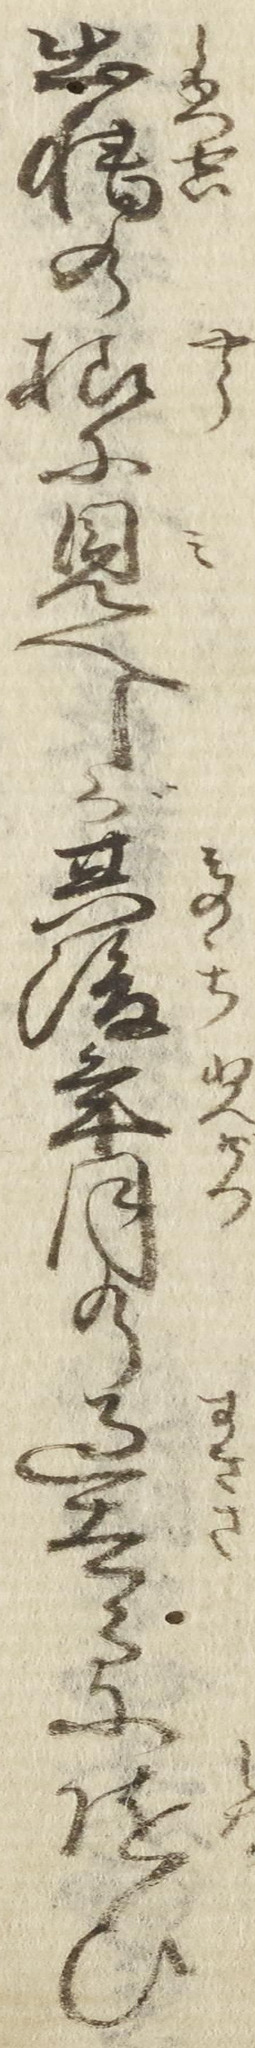出精の様に見へしが其後年月の過去るに随ひ
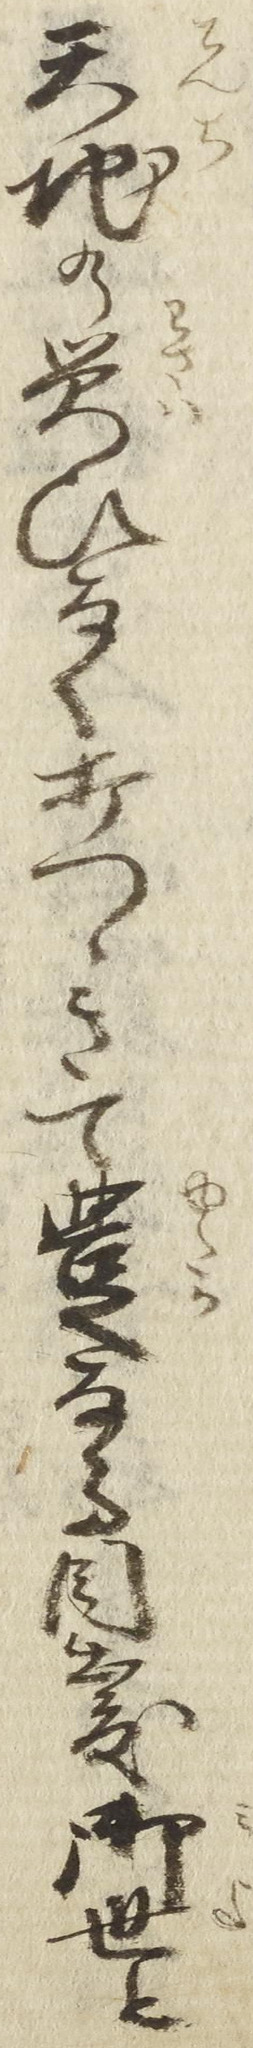天地の災ひなく打つゝきて豊なる目出度御世と

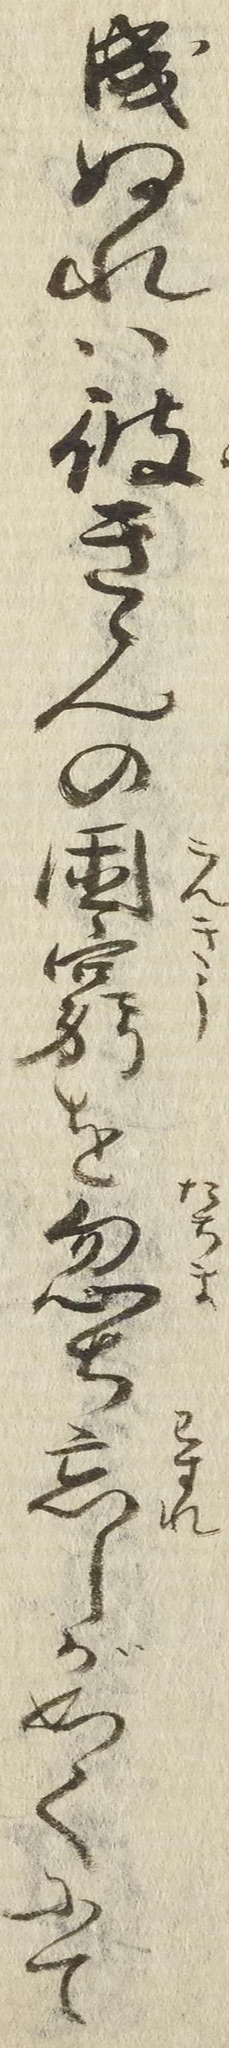成ぬれは彼きゝんの困窮を忽ち忘しが如くにて
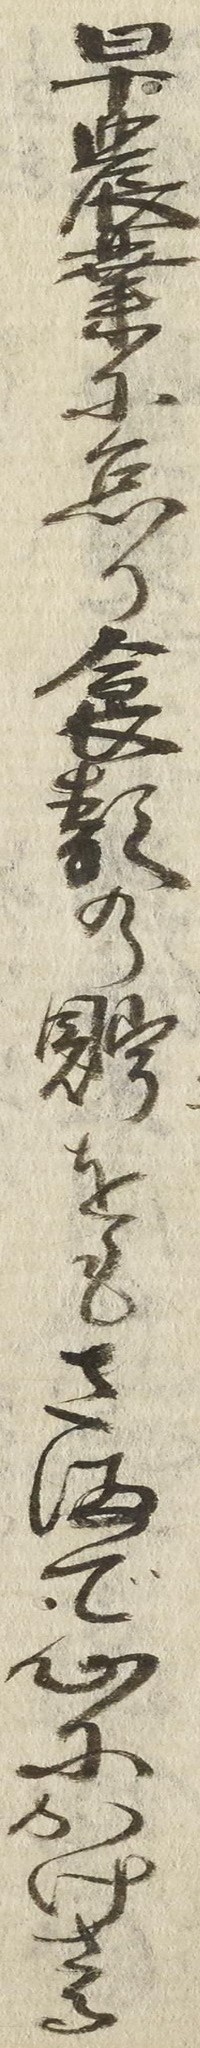早農業に怠り食類の貯をもさまで心にかけさる
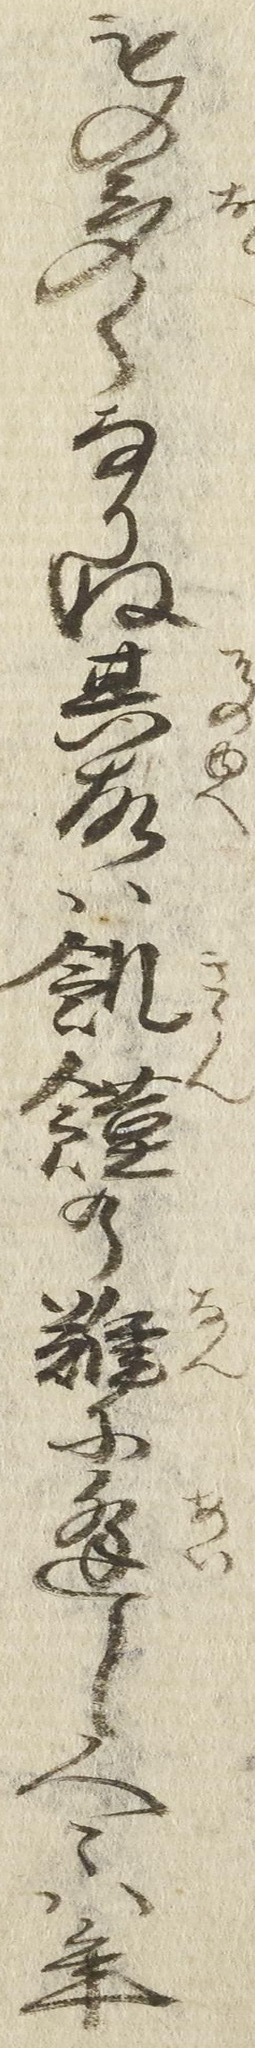もの多くなりぬ其故は飢饉の難に逢し人〻は年
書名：天明奇畧　全
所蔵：東京大学地震研究所図書室 Earthquake Research Institute Library, The University of Tokyo, JAPAN
